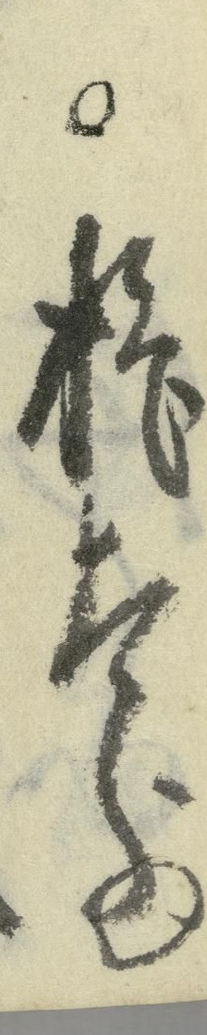権太郎
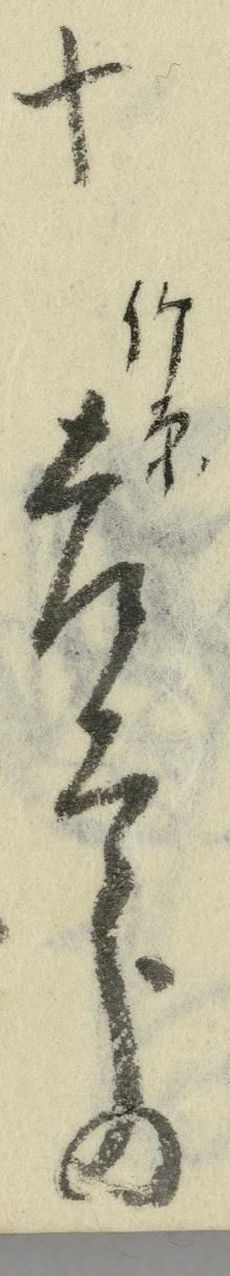十吉二郎
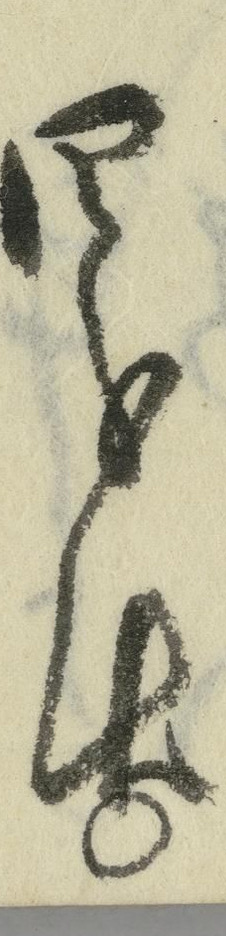四郎次
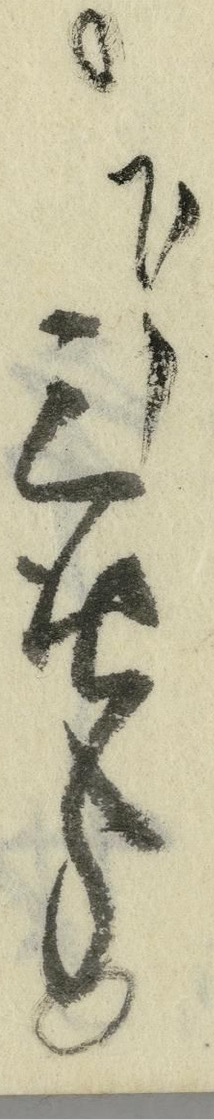三次郎
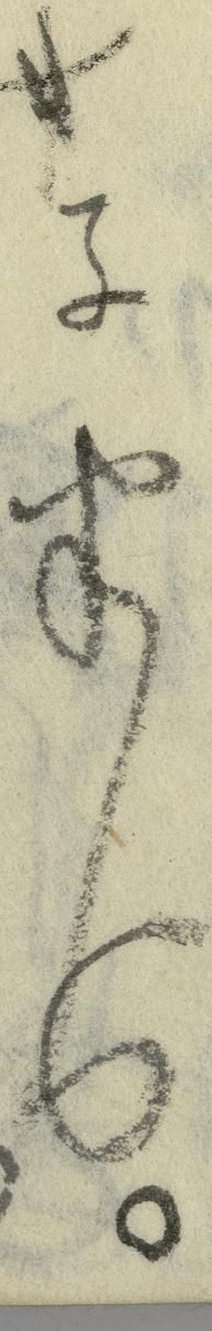子半右衛門
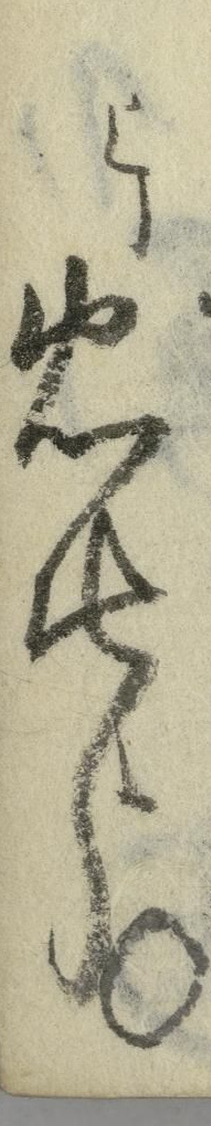忠次郎

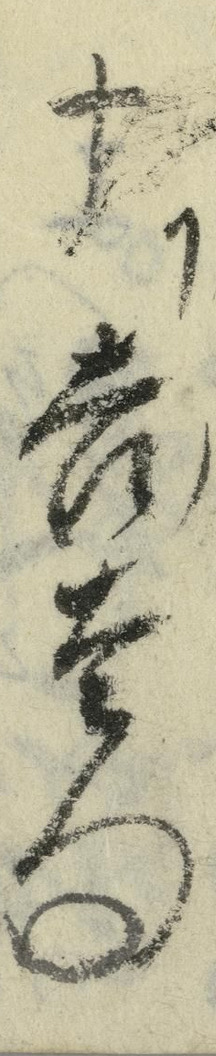十吉右衛門
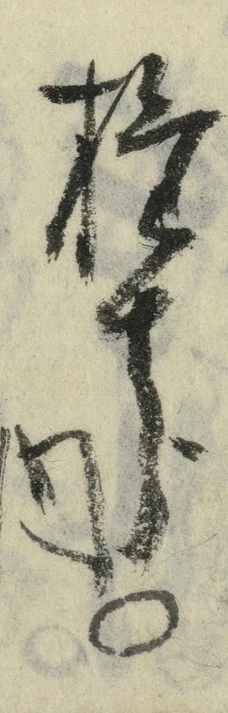権十郎
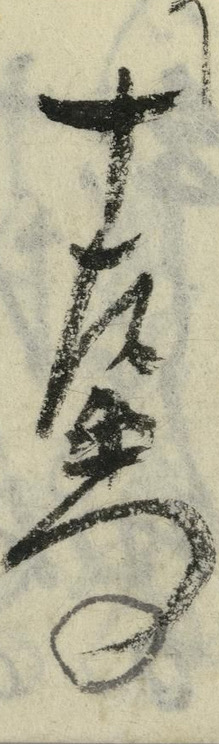十左衛門
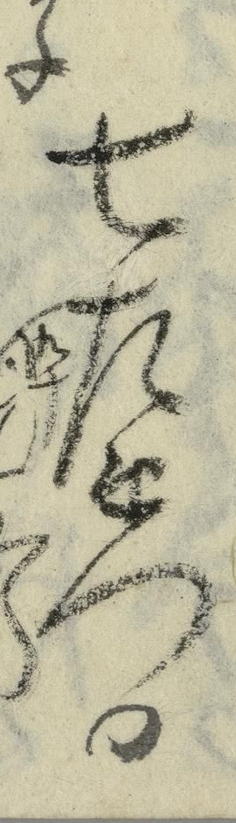七左衛門
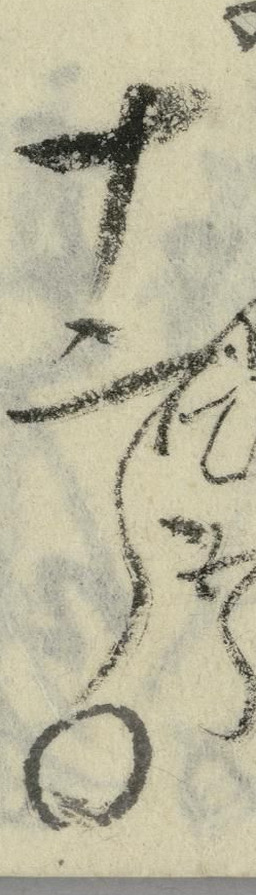十二郎
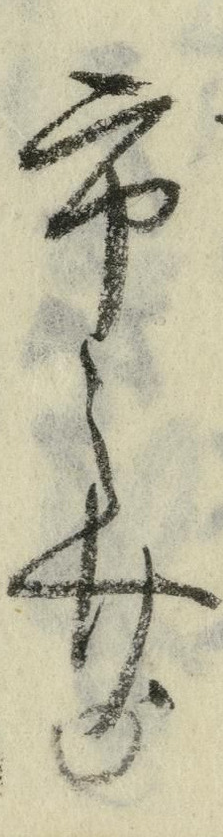市之介
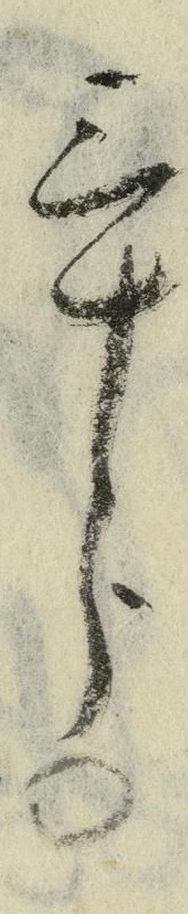三十郎
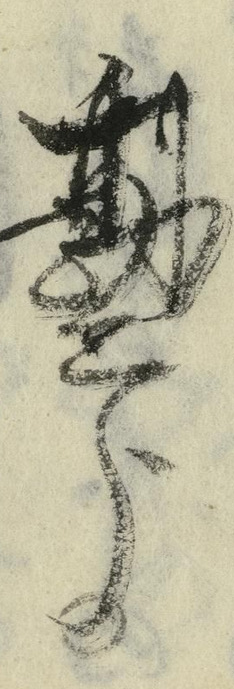勘二郎
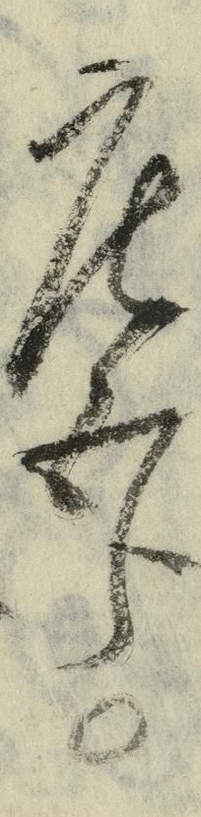庄五郎
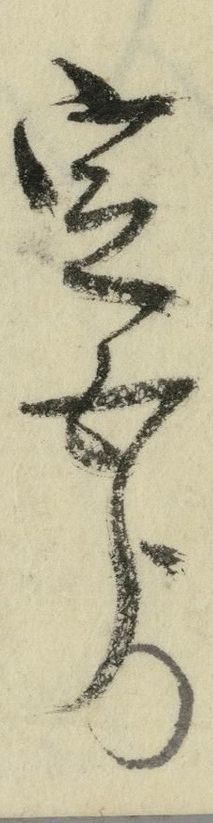庄五郎
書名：天明淺間噴火ニ関スル書類
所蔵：東京大学地震研究所図書室 Earthquake Research Institute Library, The University of Tokyo, JAPAN
